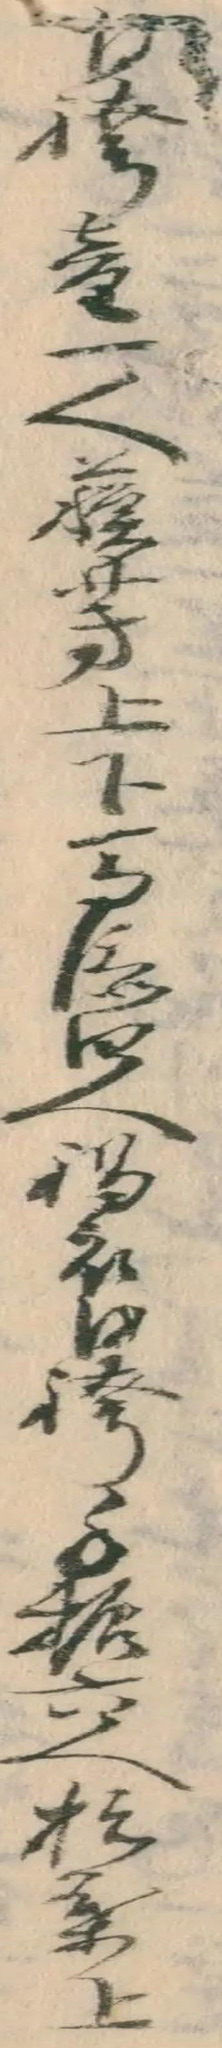切袴童一人蘇芳上下馬添四人褐衣白袴手振六人杉葉上
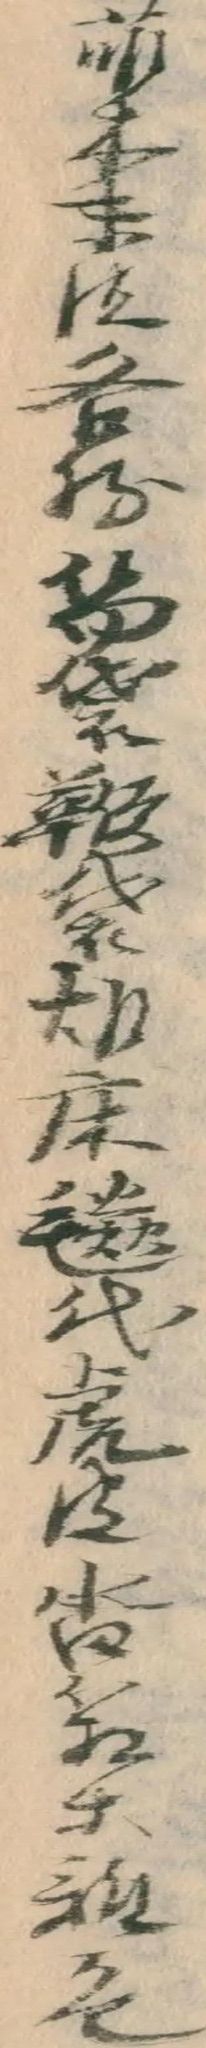萌木末濃各持筍袋鞭袋胡床毯代虎皮沓箱等雑色

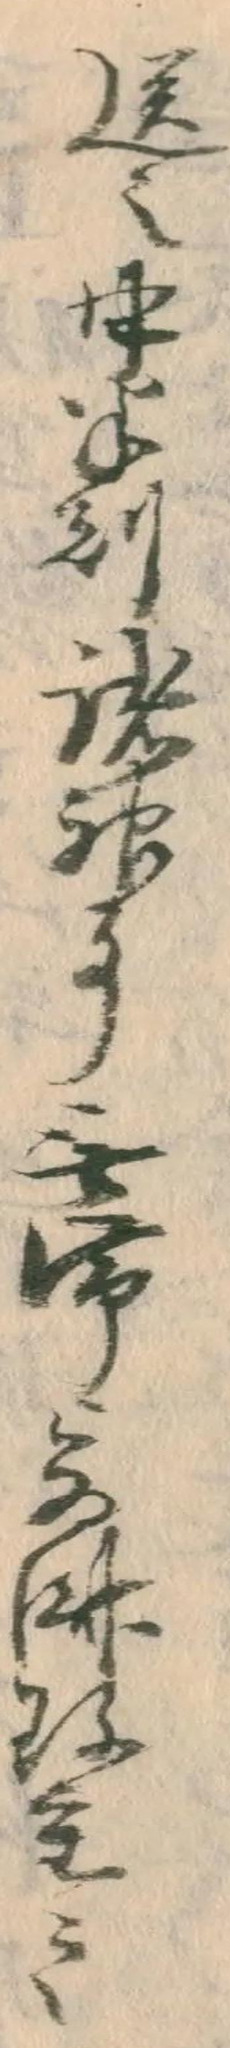送之申半刻諸神事無滞被為済珍重々々
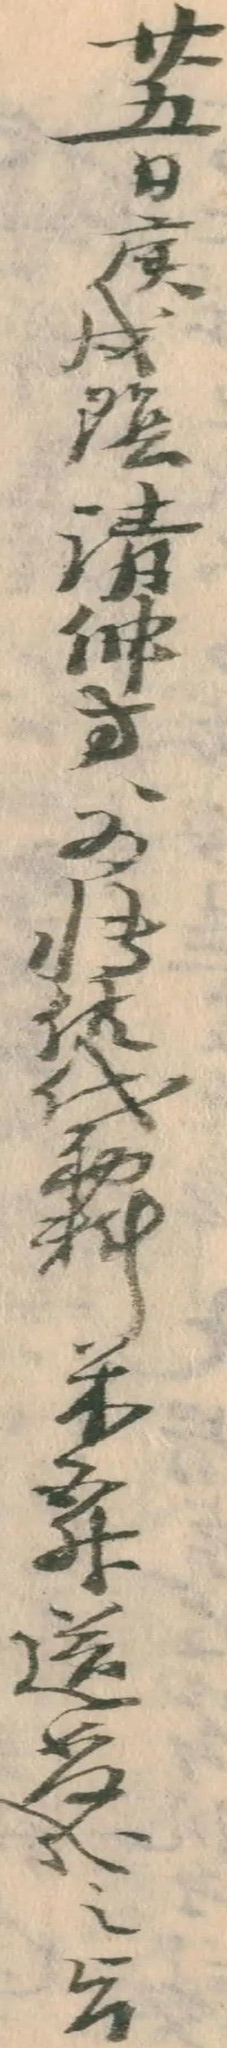廿五日庚戌陰清伸方へ為轉供代勤料米五升送如何成之旨
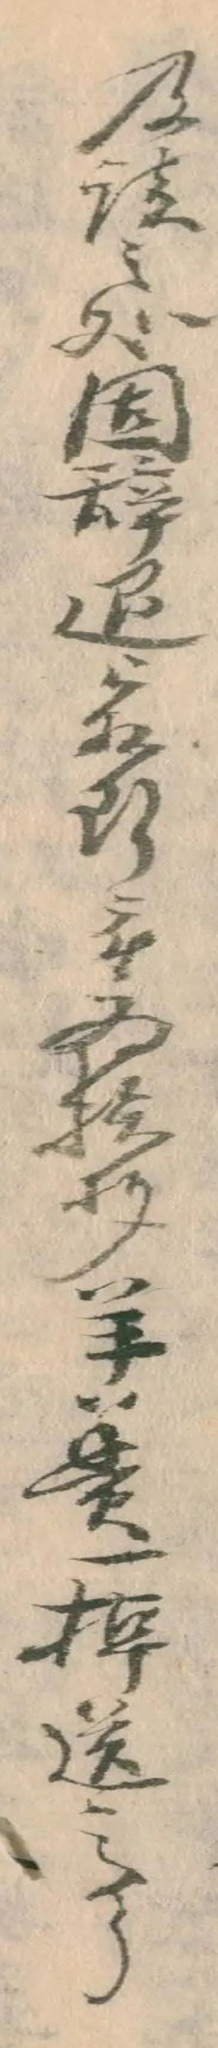及談之処固辞退被相断ニ付為挨拶羊羹一棹送之了
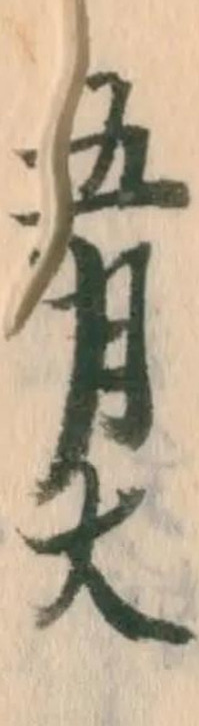五月大
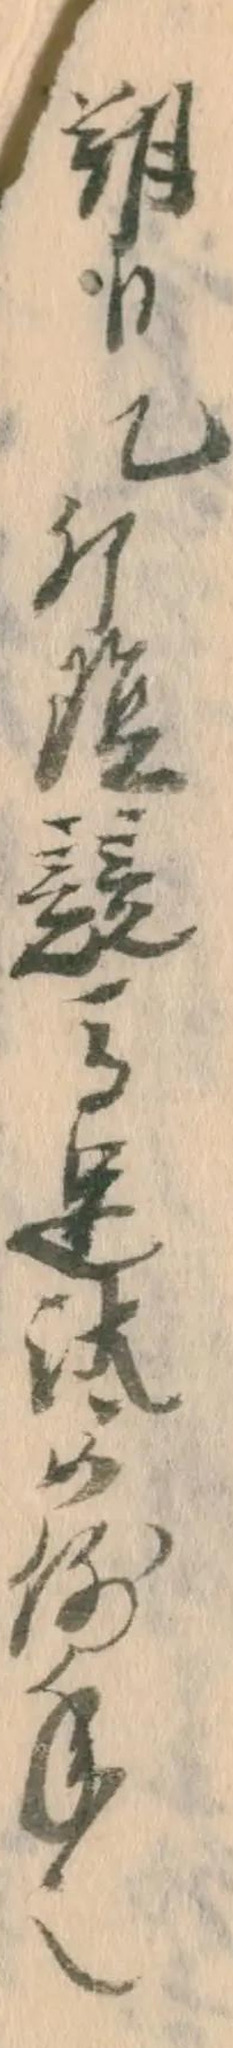朔日乙卯陰競馬足汰如例年也
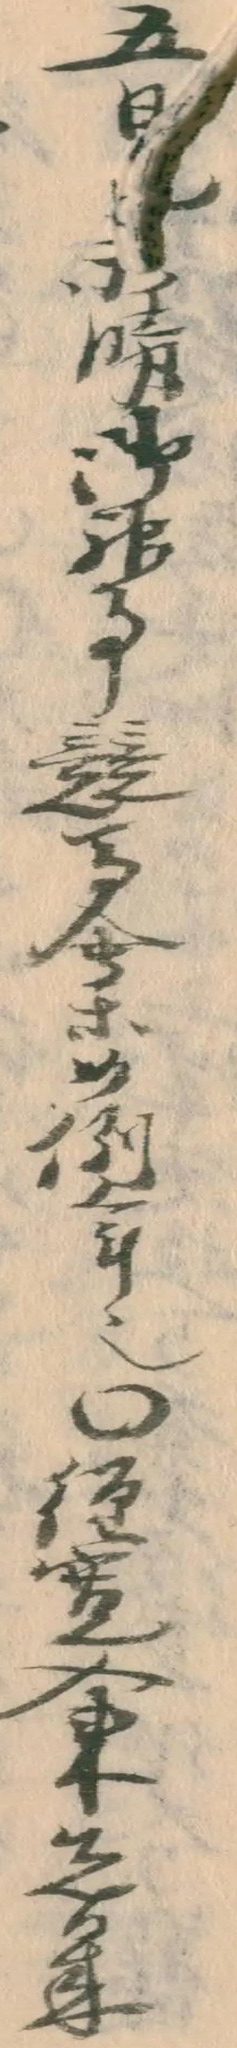五日己未晴御神事競馬會等如例年也〇経寛入来先日来
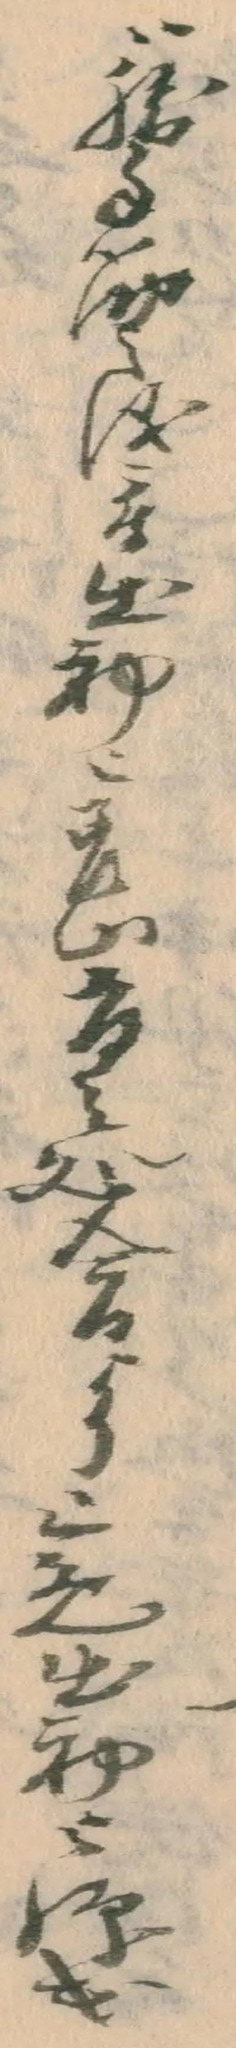御勝手筋之儀ニ付出勤被差止有之処今日より被免出勤被仰出
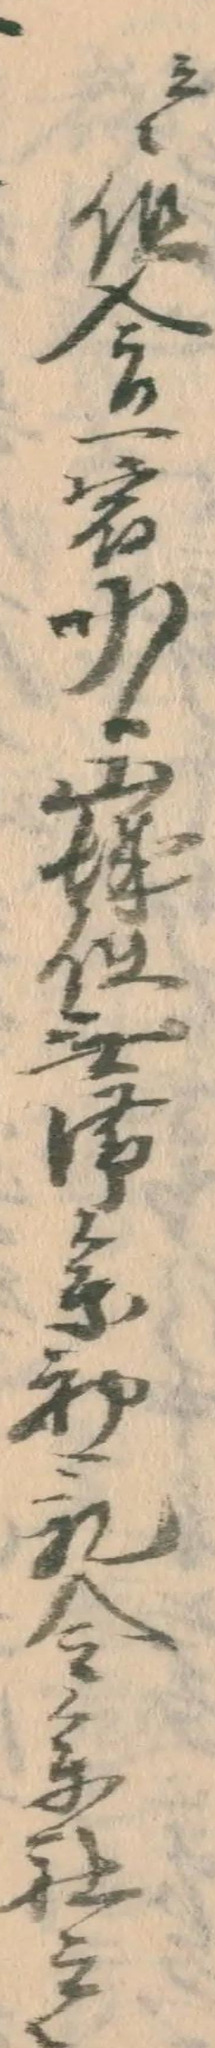云々但今日一宿明日山城使無滞参勤御礼令参社云々
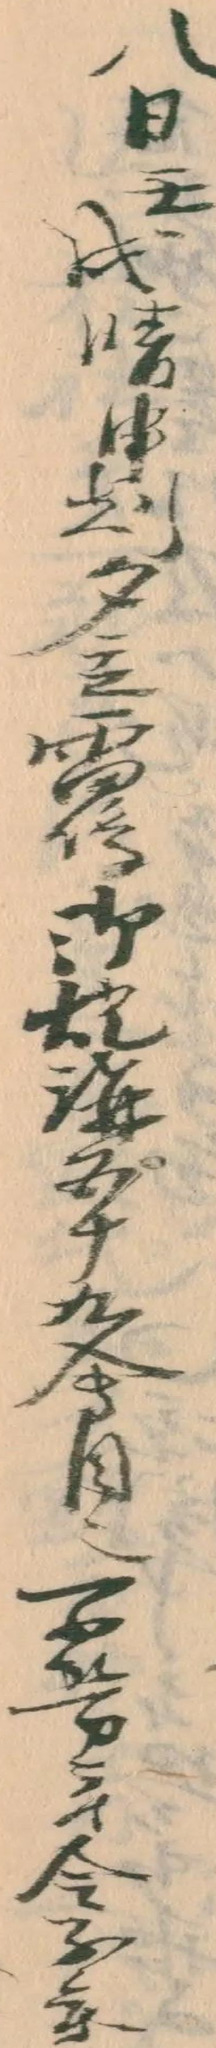八日壬戌晴申刻夕立雷鳴御燈講五十九會目也所労ニ付令不参了
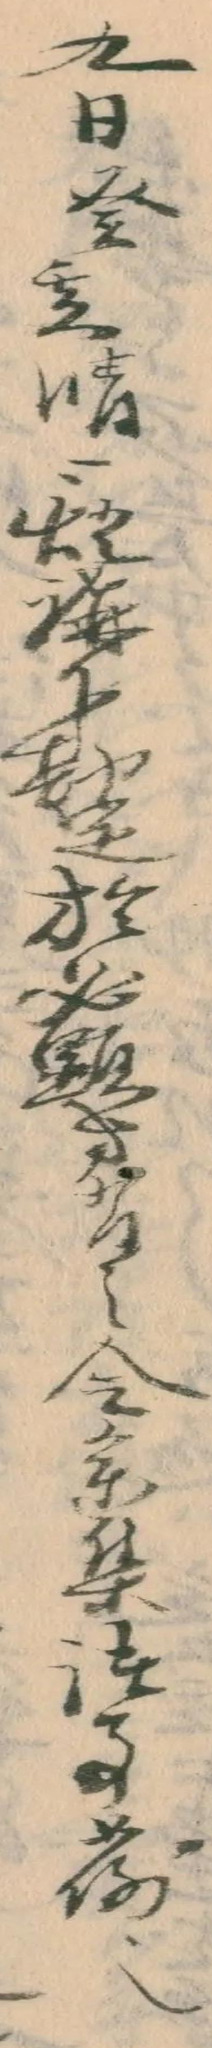九日癸亥晴御燈ｋ講下勘定於必顕方有之令参集諸事如例也
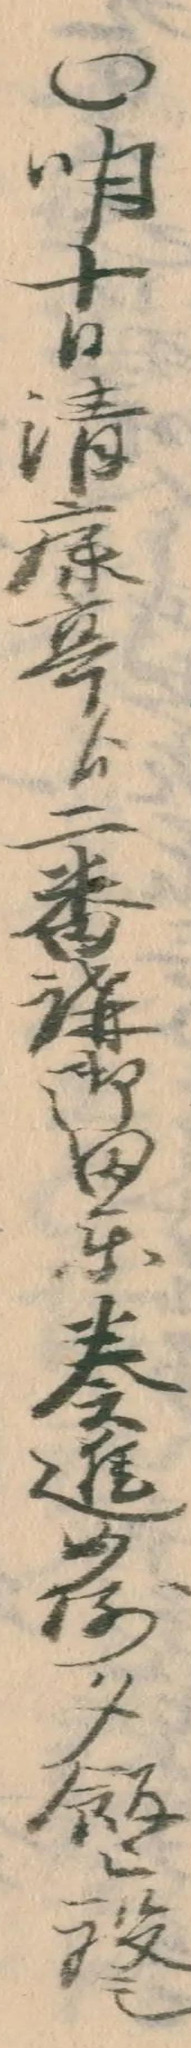○明十日清康亭ゟ二番講御田楽奏進如例夕飯被設之
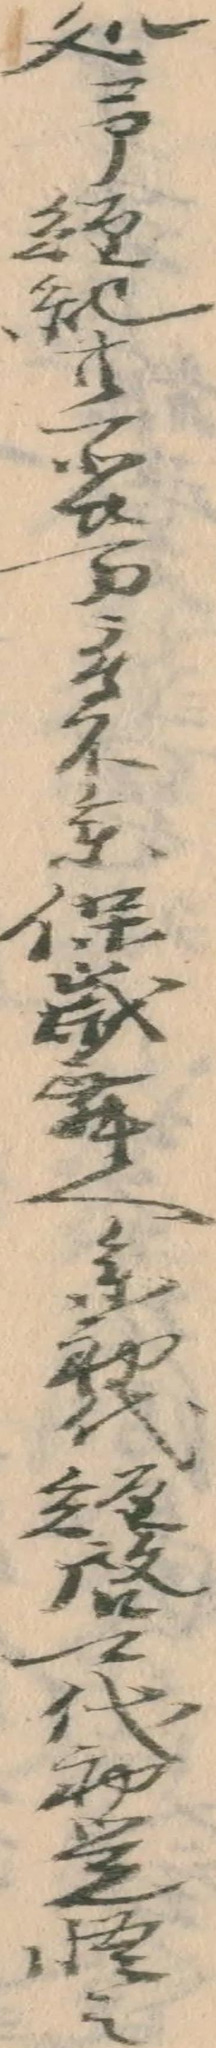処予経紀共所労ニ付不参保歳舞人参勤代経啓可代勤覚悟之
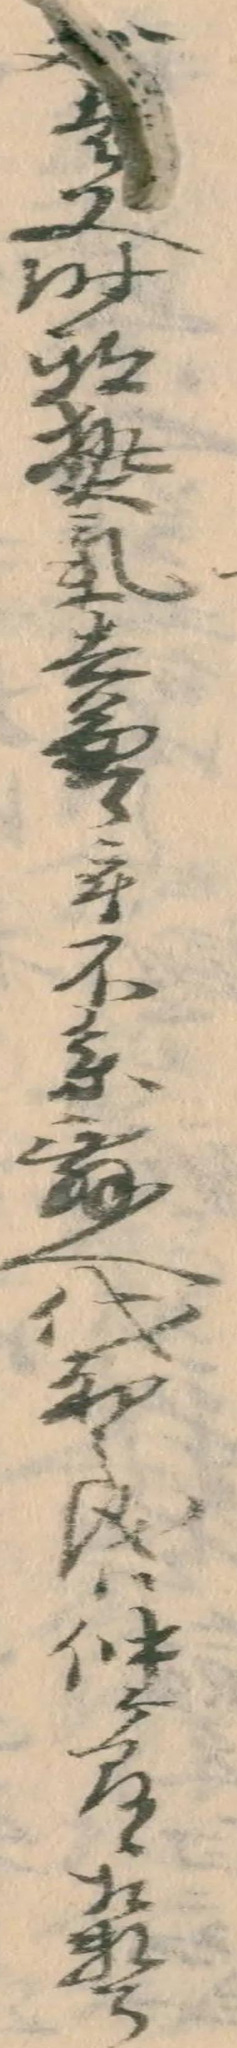処是又時邪熱気去兼候ニ付不参舞人代勤之儀ハ仲ヶ間ニ相頼了
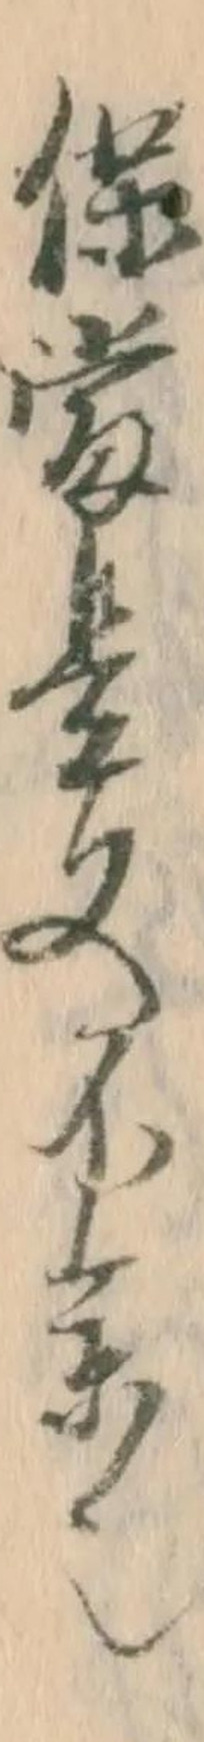保當是又不参也
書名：賀茂社記録. 第70冊
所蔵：国立国会図書館 National Diet Library, JAPAN
